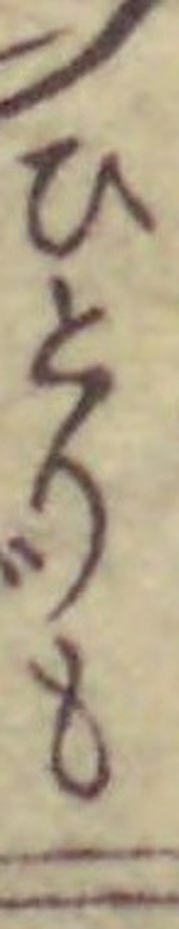ひとりも
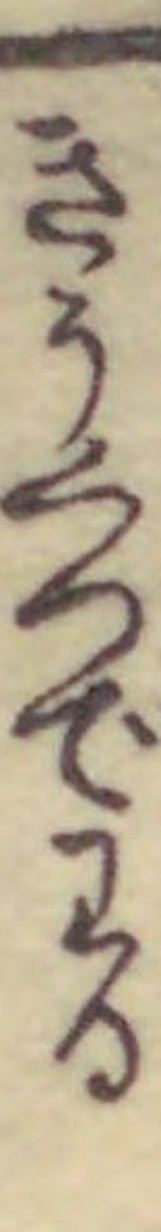きうくつでわる
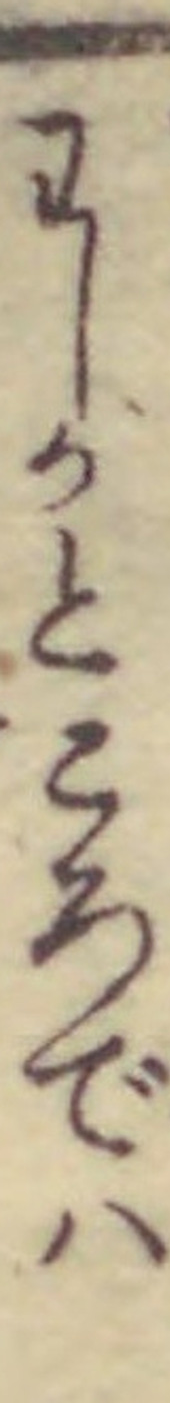わしかところでは
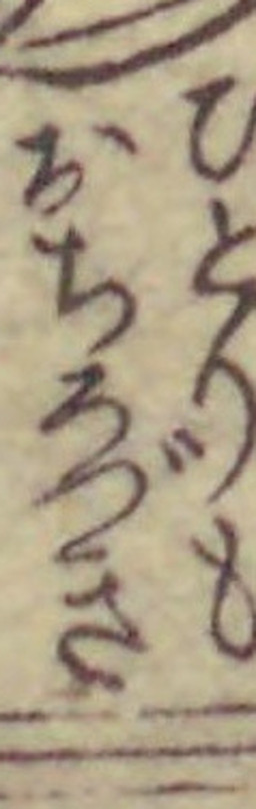おちかづき
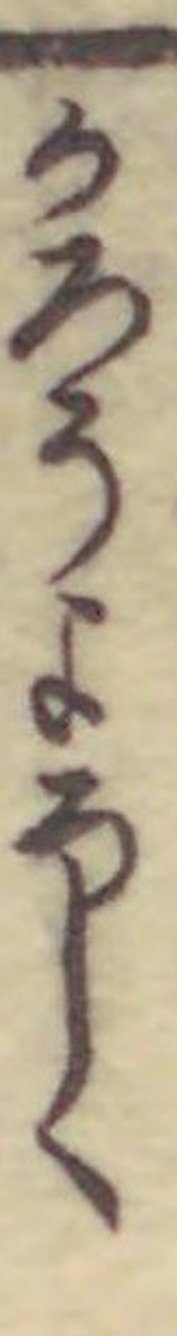かろうよろしく
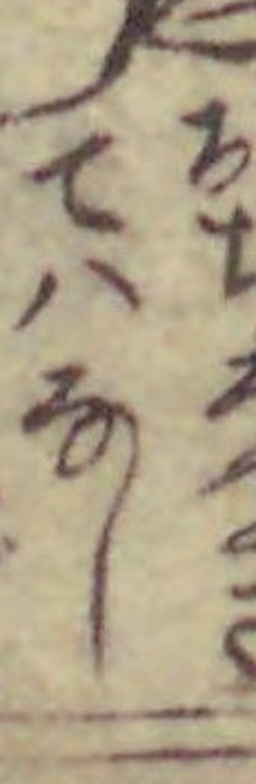てはなし
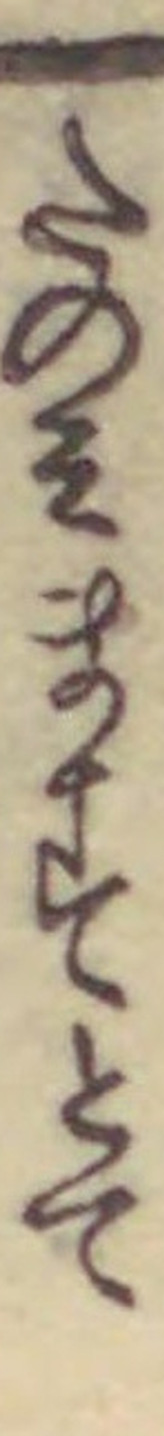たのみますとて
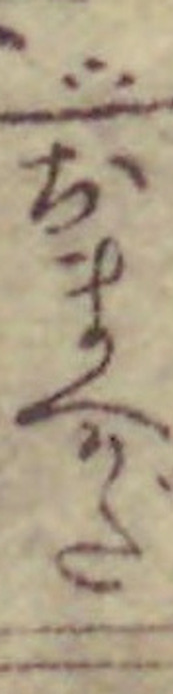おまへがた
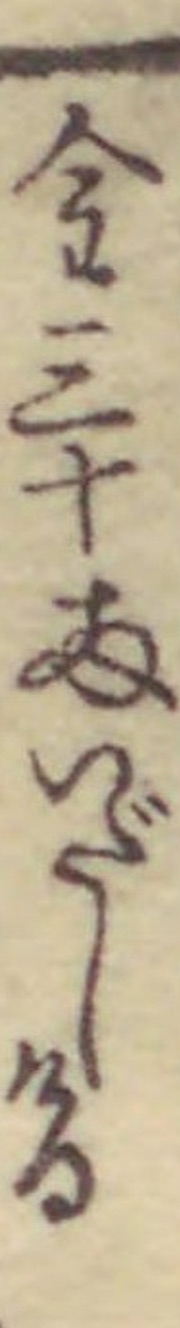金三十両いだしける
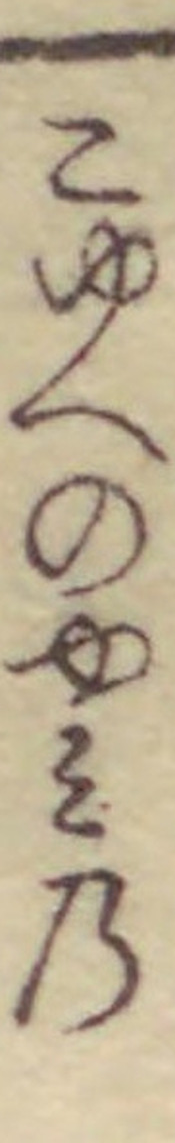こゆへのやみの
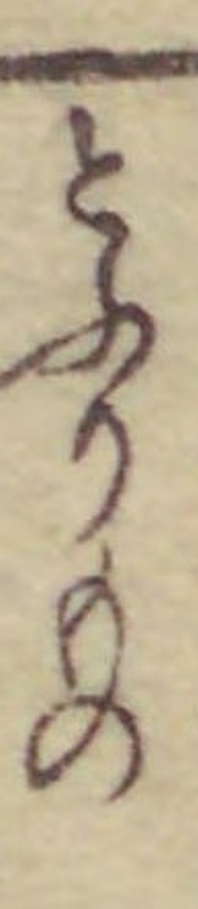とふりもの
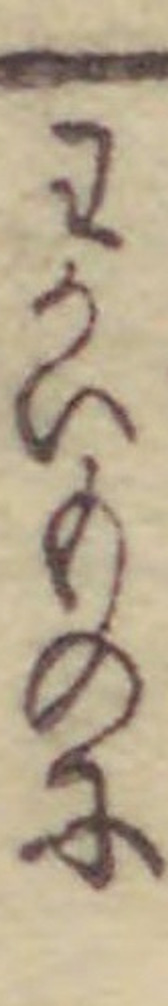わかいものに
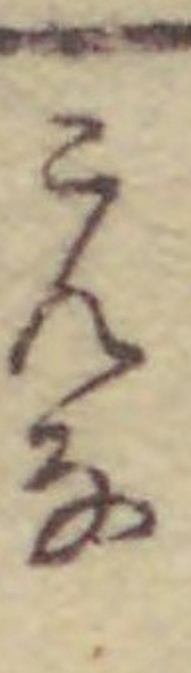こんな
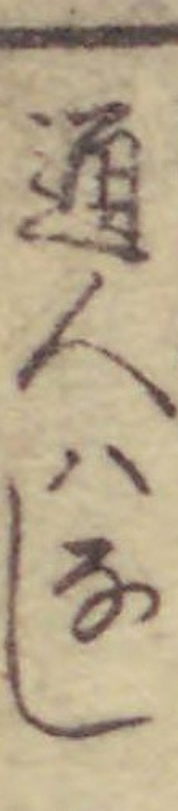通人はなし

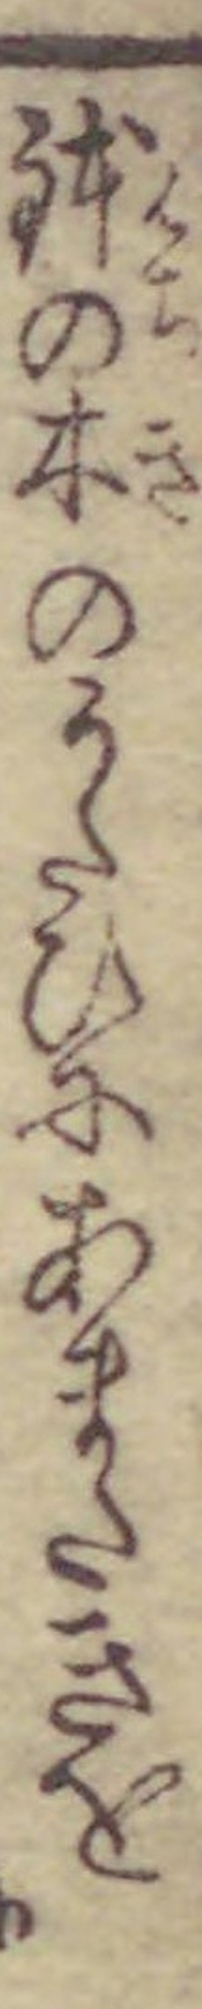鉢の木のうたひにあまたきを
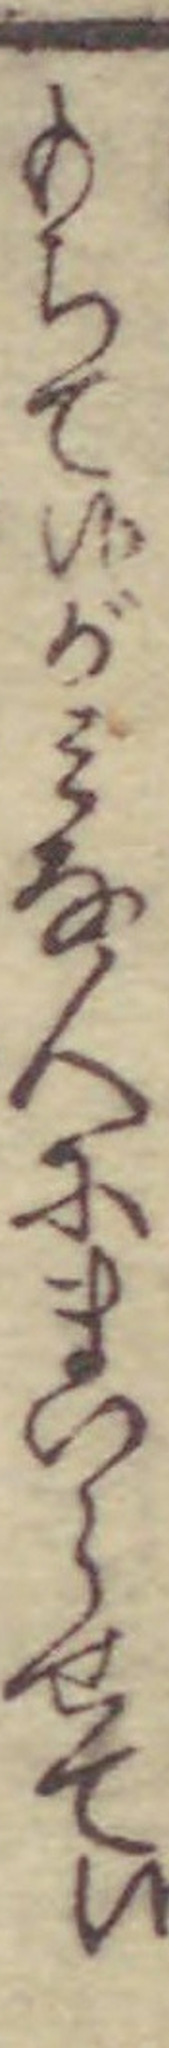もちて候がみな人にまいらせて候
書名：大通人穴[サガシ] 3巻
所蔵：国立国会図書館 National Diet Library, JAPAN
